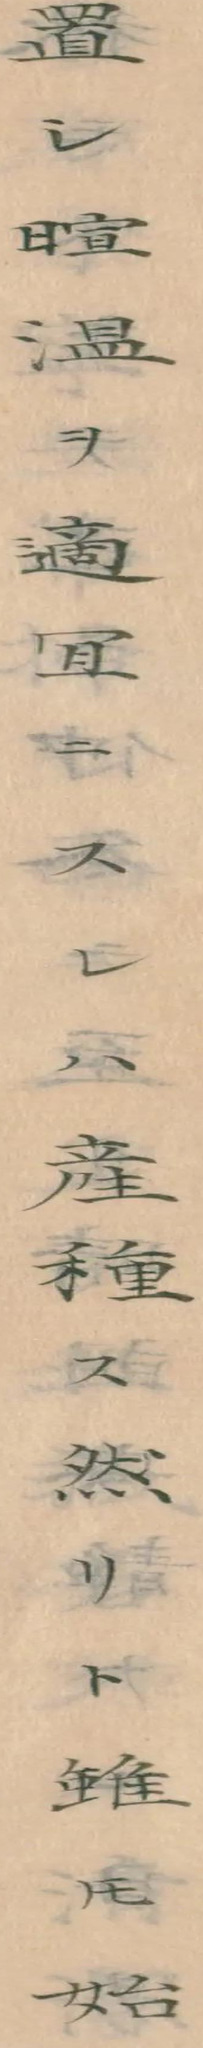置シ喧温ヲ適宜ニスレハ産種ス然リト雖トモ始
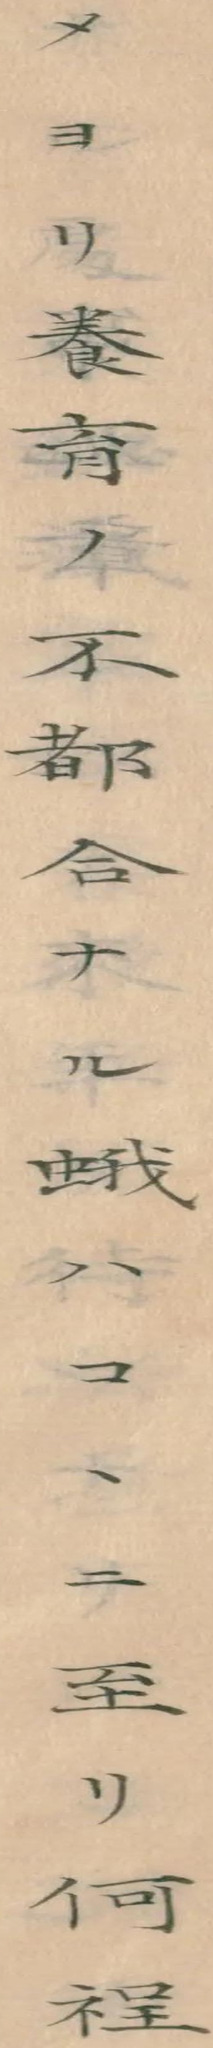メヨリ養育ノ不都合ナル蛾ハコヽニ至リ何程
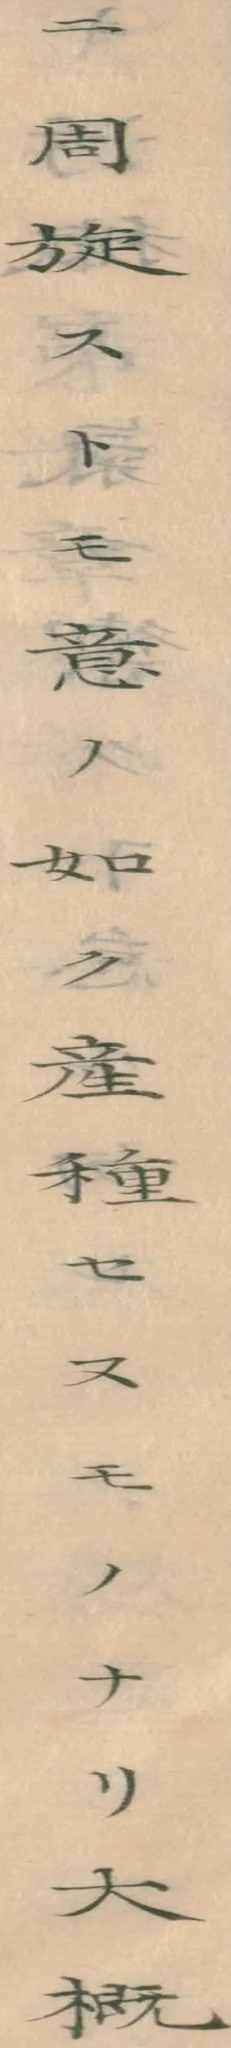ニ周旋ストモ意ノ如ク産種セスモノナリ大概
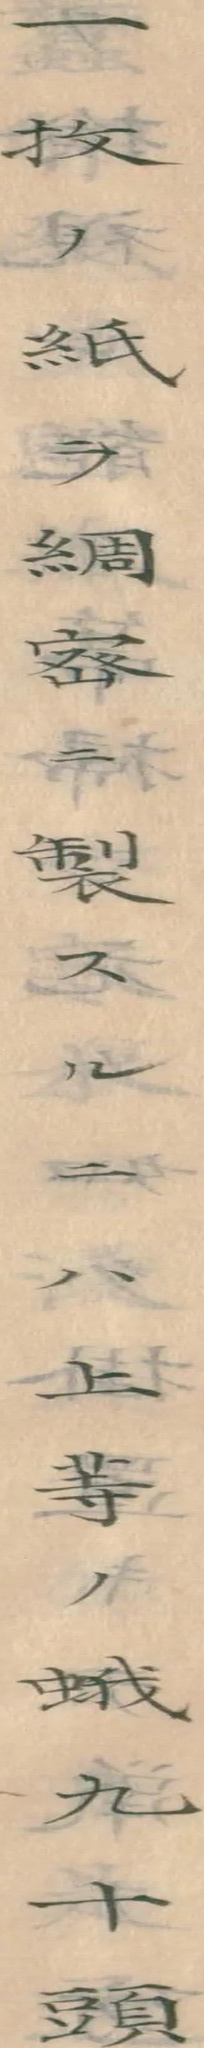一枚ノ紙ヲ綢密ニ製スルニハ上等ノ蛾九十頭
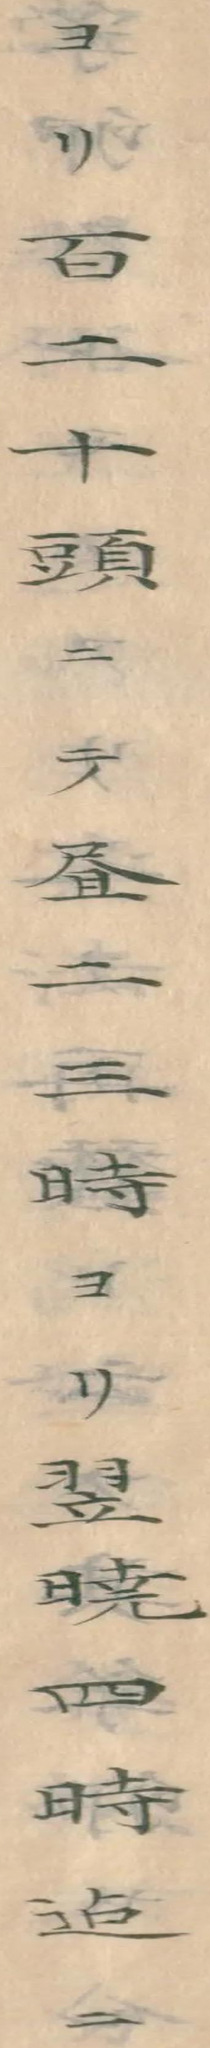ヨリ百二十頭ニテ昼二三時ヨリ翌暁四時迄ニ
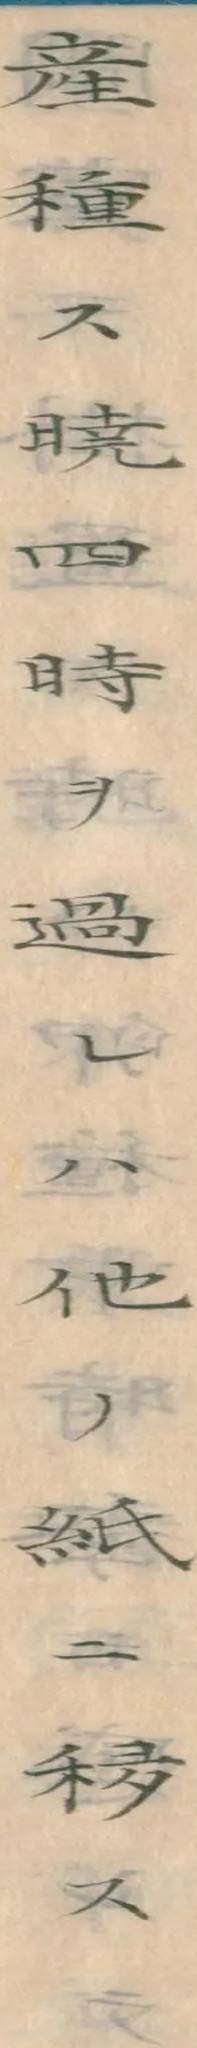産種ス暁四時ヲ過レハ他ノ紙ニ移ス
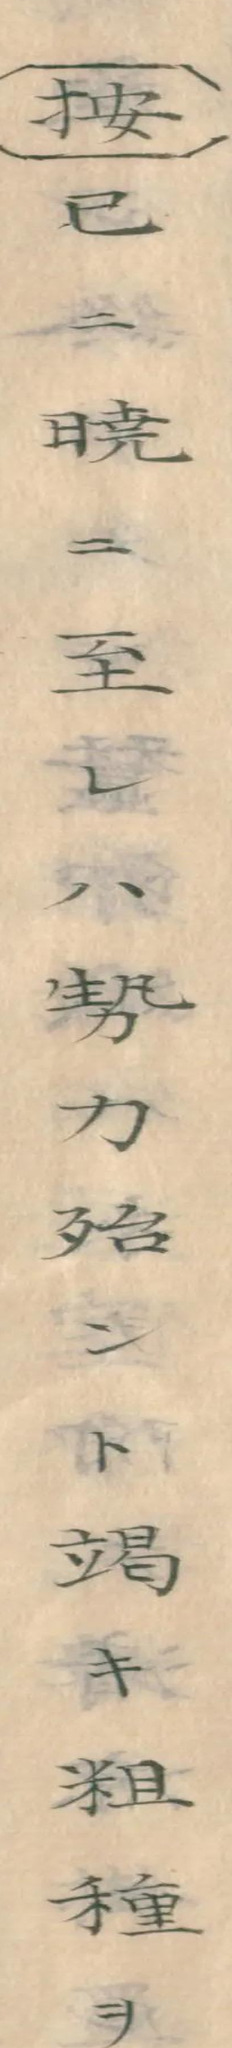[按]已ニ暁ニ至レハ勢力殆ント竭キ粗種ヲ
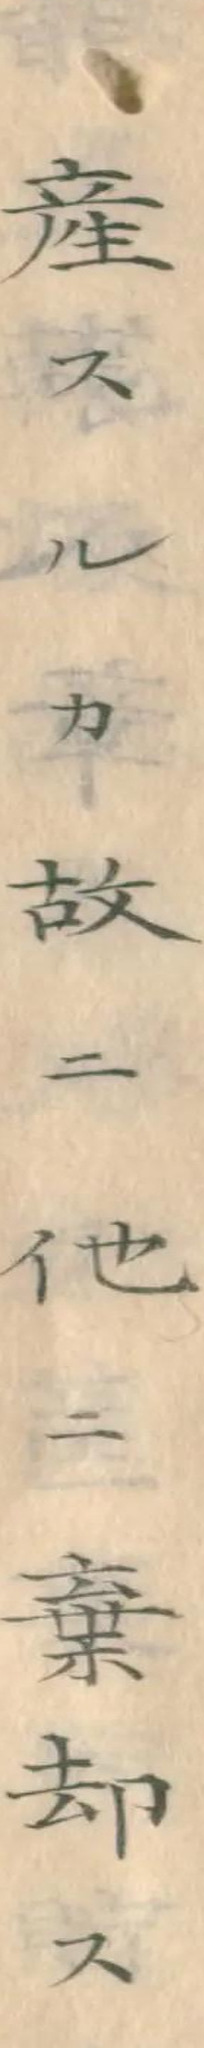産スルカ故ニ他ニ棄却ス
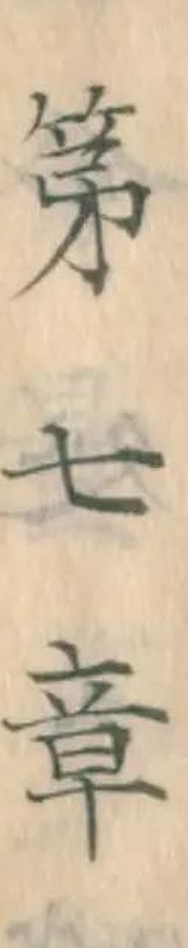第七章
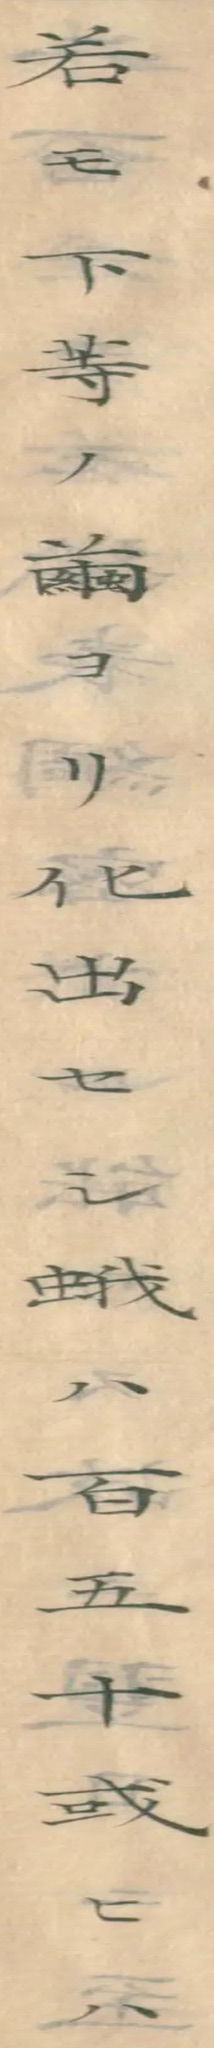若モ下等ノ繭ヨリ化出セシ蛾ハ百五十或ヒハ

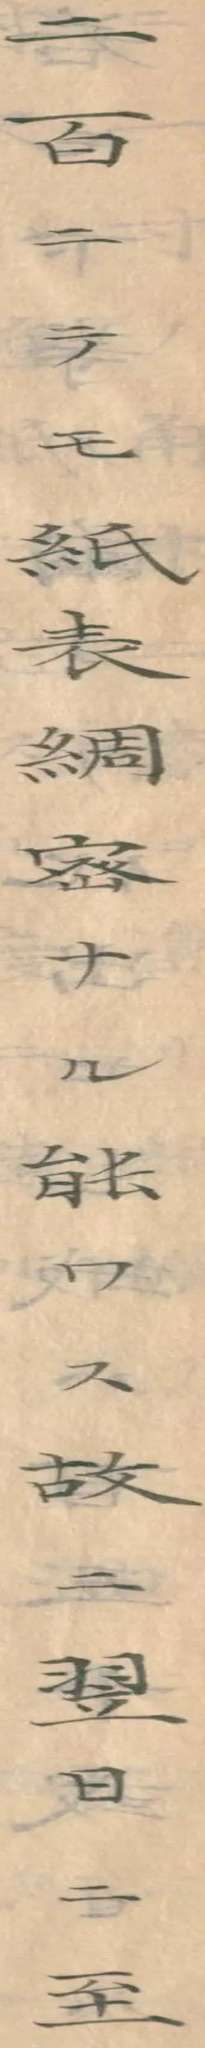二百ニテモ紙表綢密ナル能ワス故ニ翌日ニ至
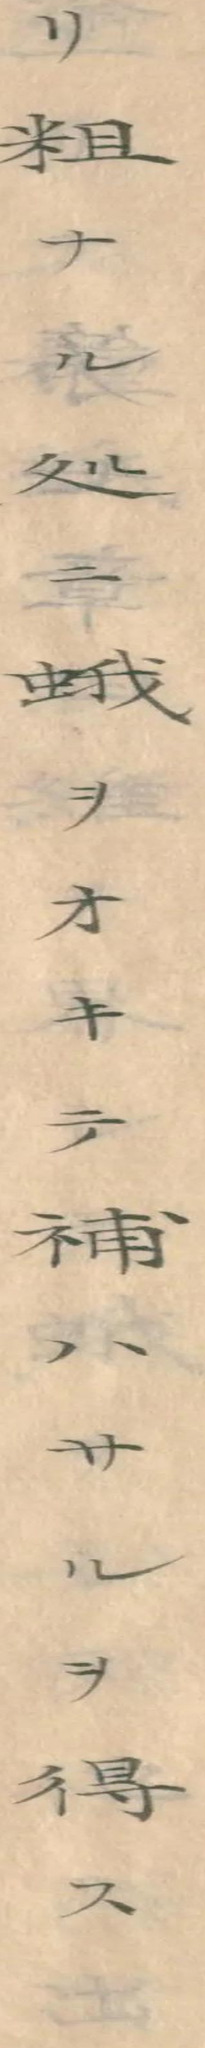リ粗ナル処ニ蛾ヲオキテ補ハサルヲ得ス
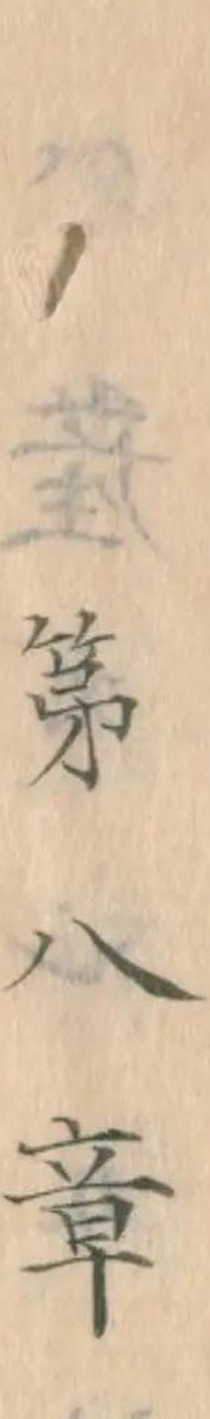第八章
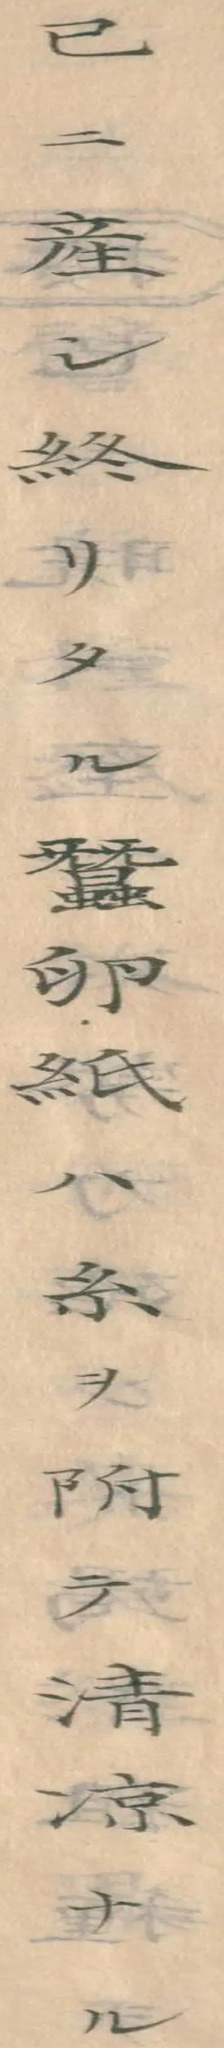已ニ産シ終リタル蚕卵紙ハ糸ヲ附テ清涼ナル
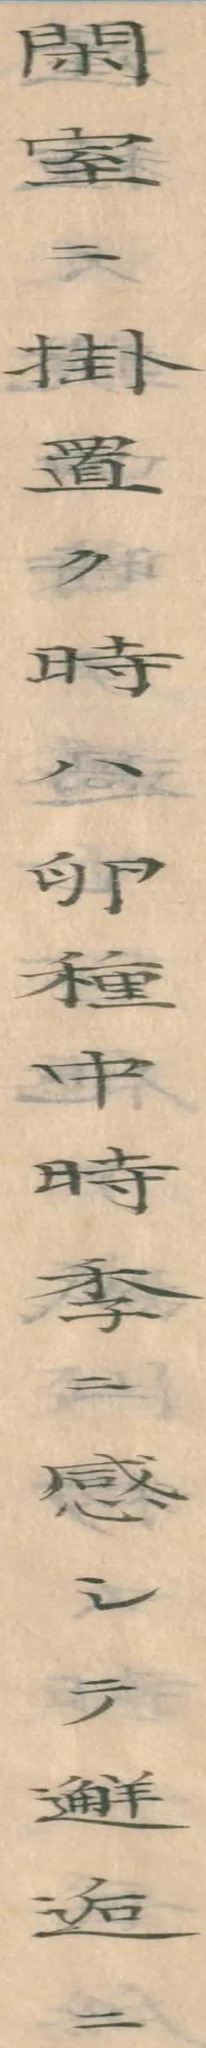閑室ニ掛置ク時ハ卵種中時季ニ感シテ邂逅ニ
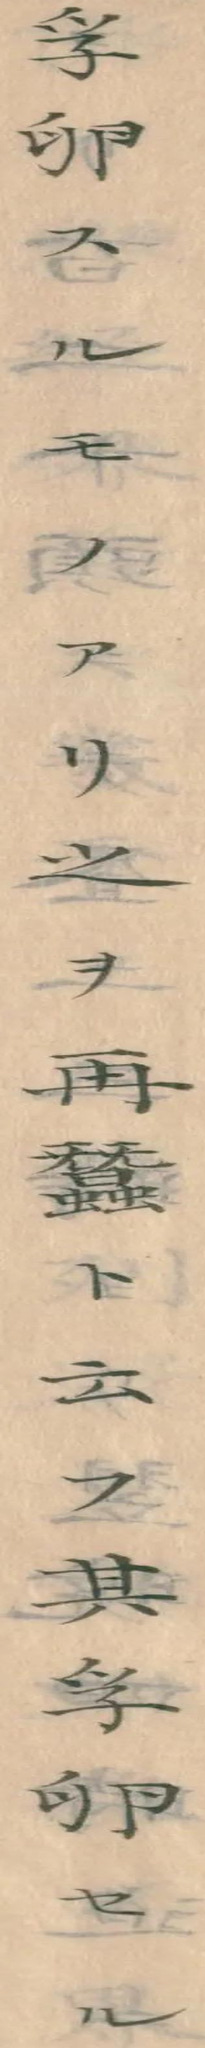孚卵スルモノアリ之ヲ再蚕ト云フ其孚卵セル
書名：蚕桑集成
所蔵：国立国会図書館 National Diet Library, JAPAN
